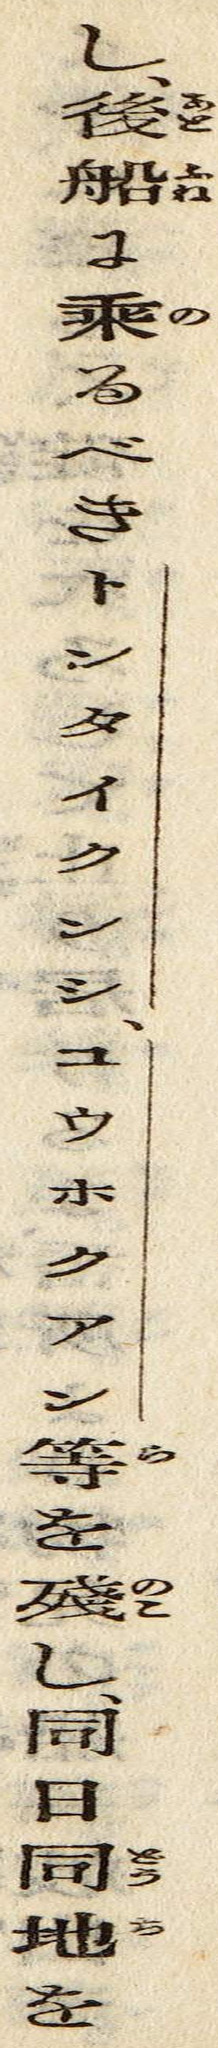し、後船に乗るべきトンタイクンシ、ユウホクアン等を残し、同日同地を
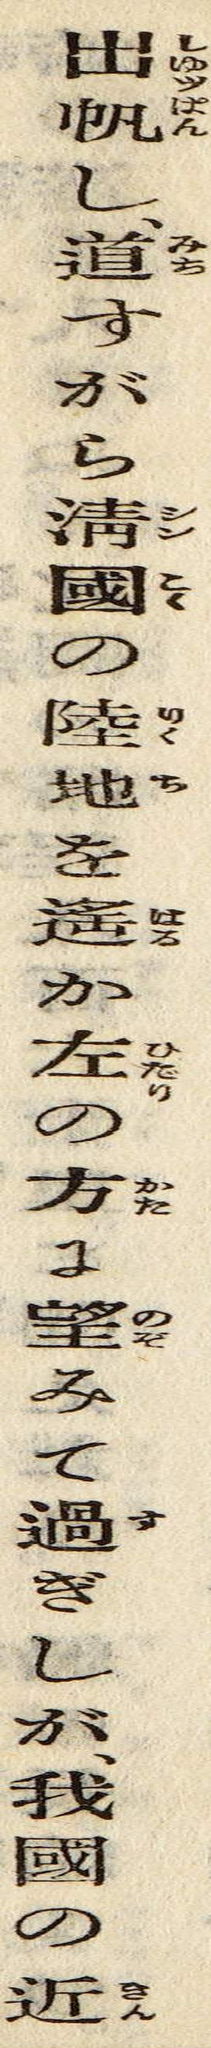出帆し、道すがら清国の陸地を遥か左の方に望みて過ぎしが、我国の近
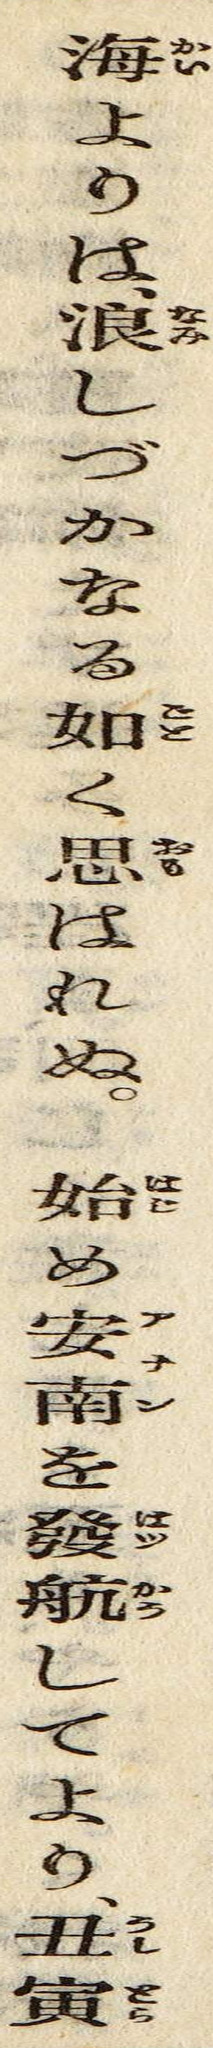海よりは、浪しづかなる如く思はれぬ。始め安南を発航してより、丑寅

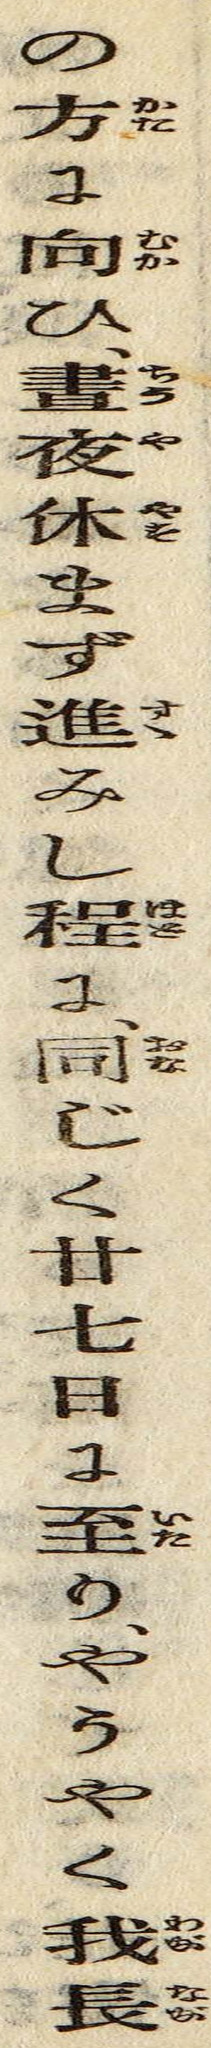の方に向ひ、昼夜休まず進みし程に、同じく廿七日に至り、やうやく我長
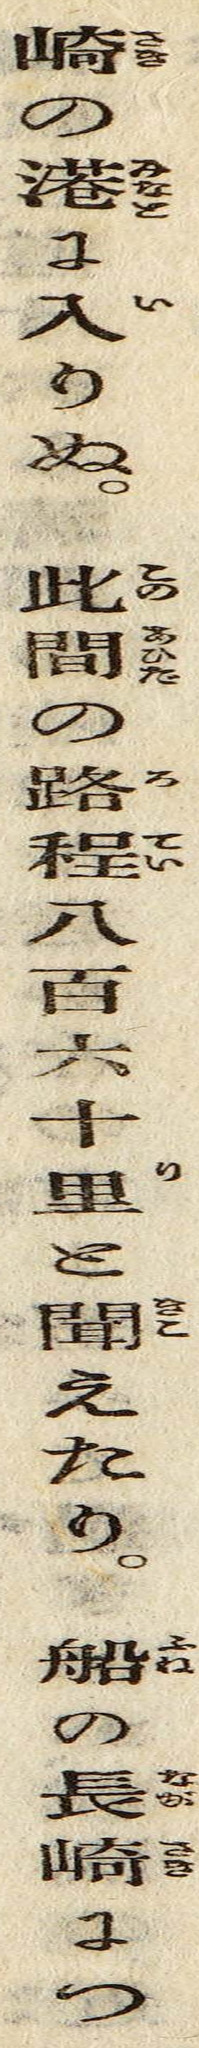崎の港に入りぬ。此間の路程八百六十里と聞えたり。船の長崎につ
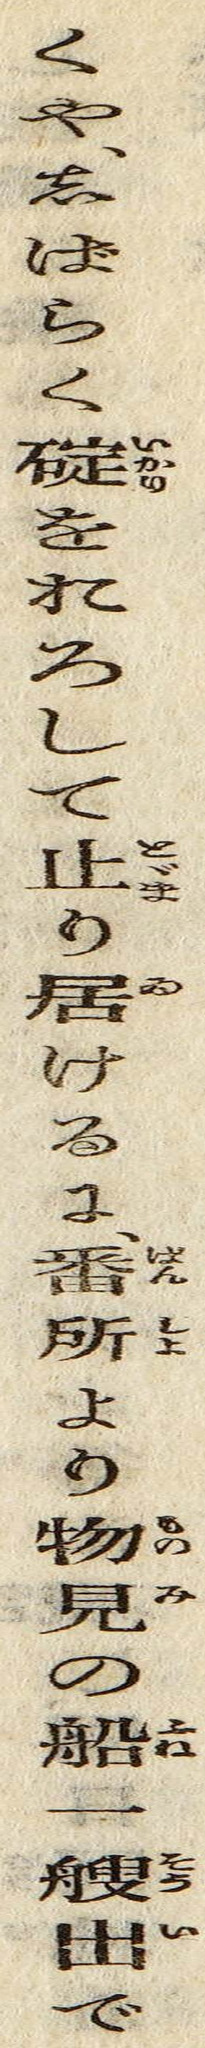くや、しばらく碇をおろして止り居けるに、番所より物見の船一艘出で
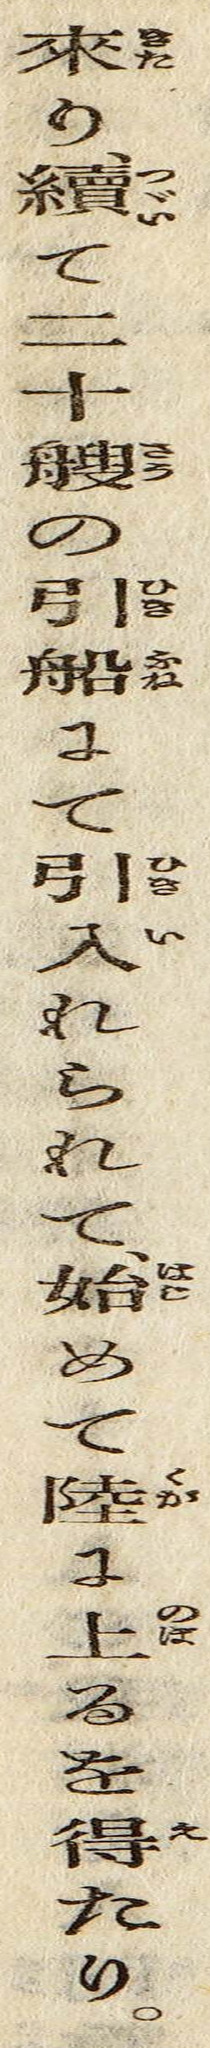来り、続て二十艘の引船にて引入れられて、始めて陸に上るを得たり。
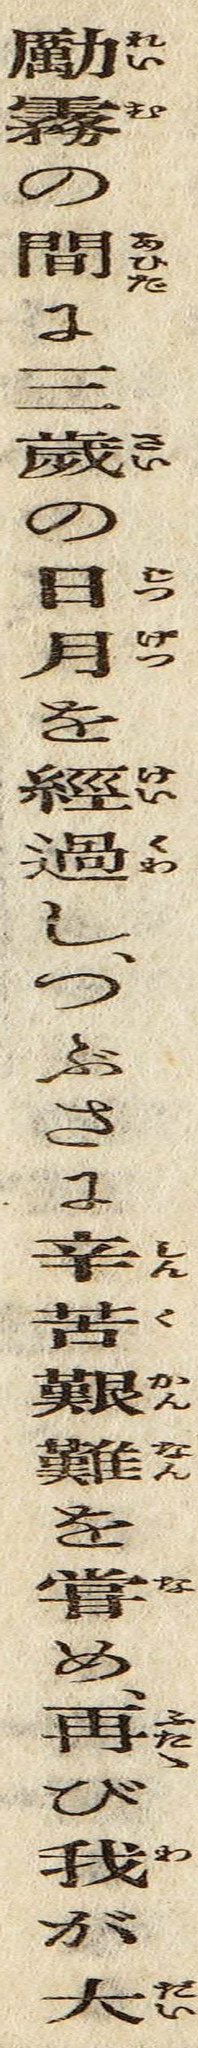励霧の間に三歳の日月を経過し、つぶさに辛苦艱難を嘗め、再び我が大
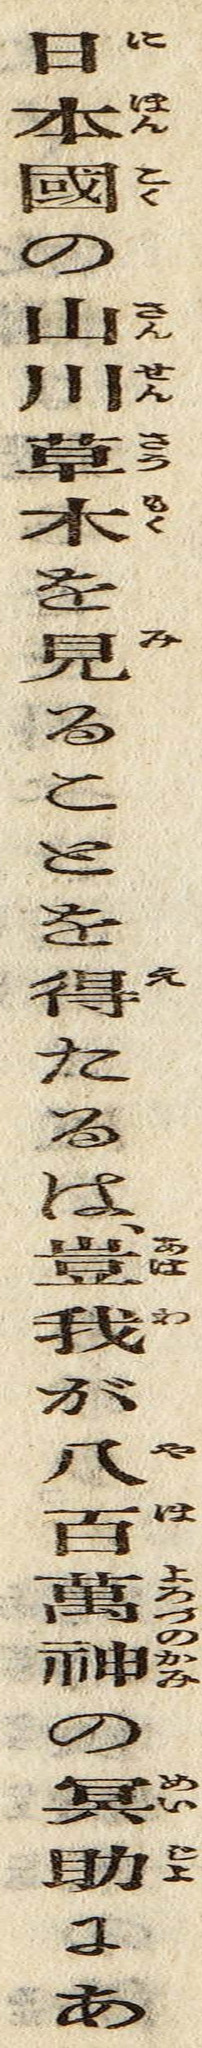日本国の山川草木を見ることを得たるは、豈我が八百万神の冥助にあ
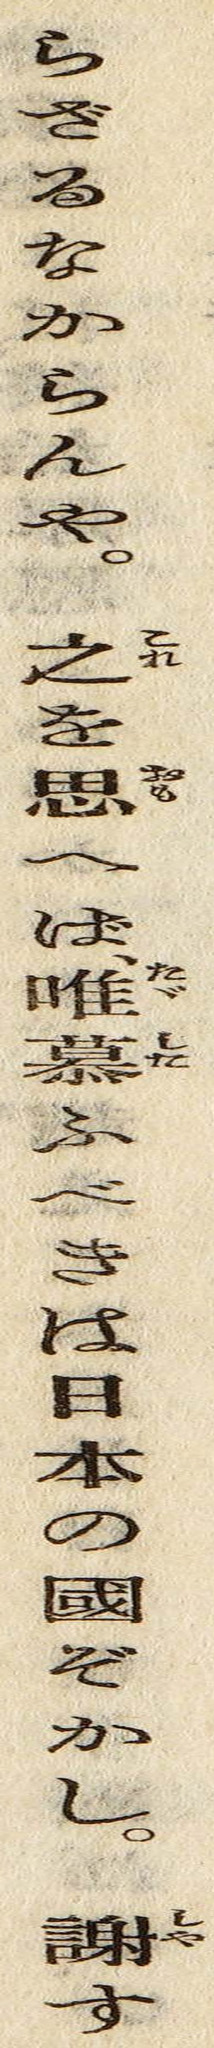らざるなからんや。之を思へば、唯慕ふべきは日本の国ぞかし。謝す
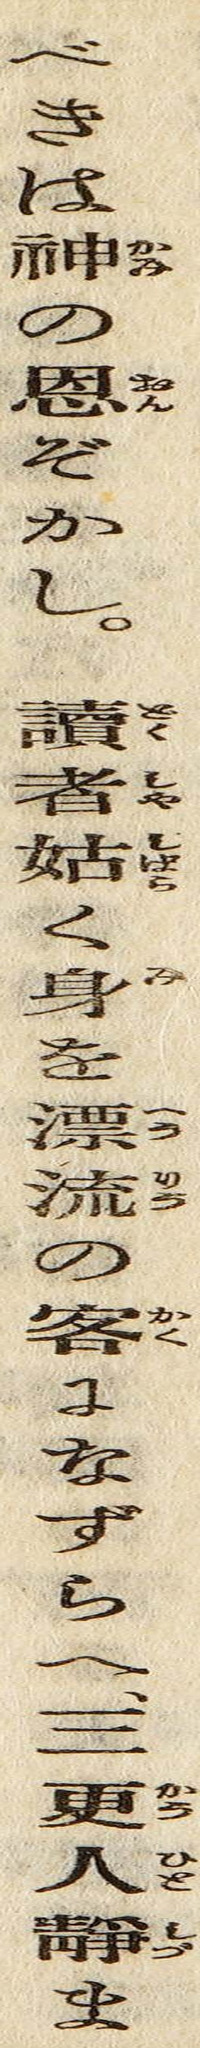べきは神の恩ぞかし。読者姑く身を漂流の客になずらへ、三更人静ま
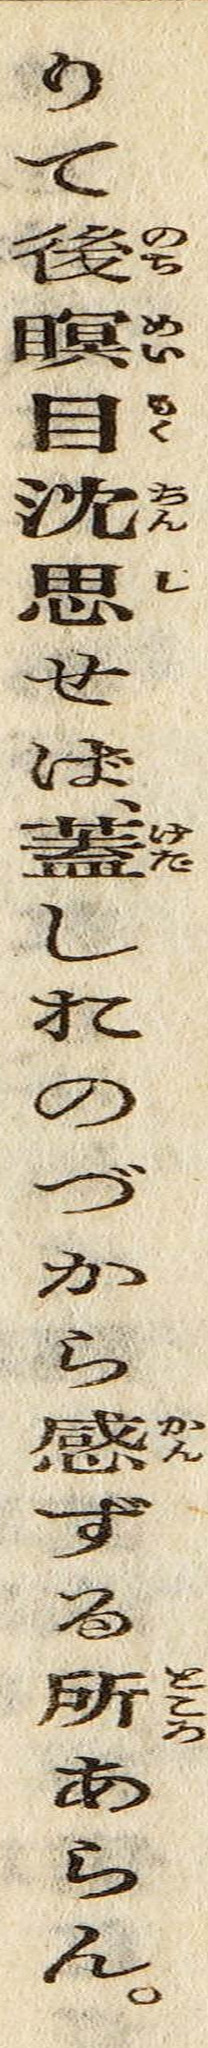りて後瞑目沈思せば、蓋しおのづから感ずる所あらん。
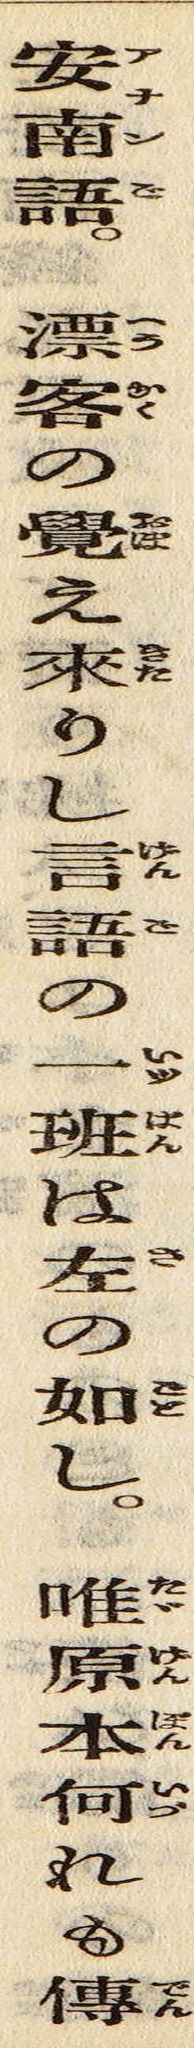安南語。漂客の覚え来りし言語の一班は左の如し。唯原本何れも伝
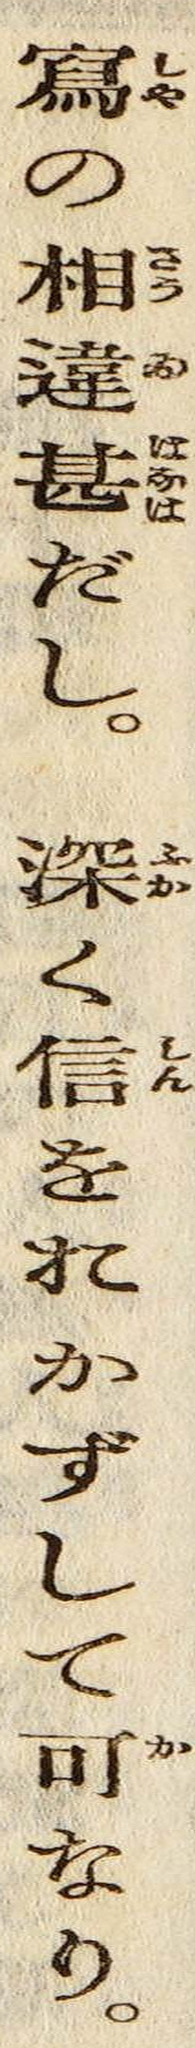写の相違甚だし。深く信をおかずして可なり。
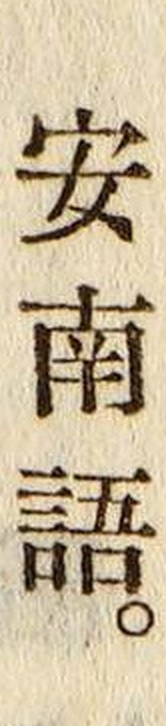安南語。
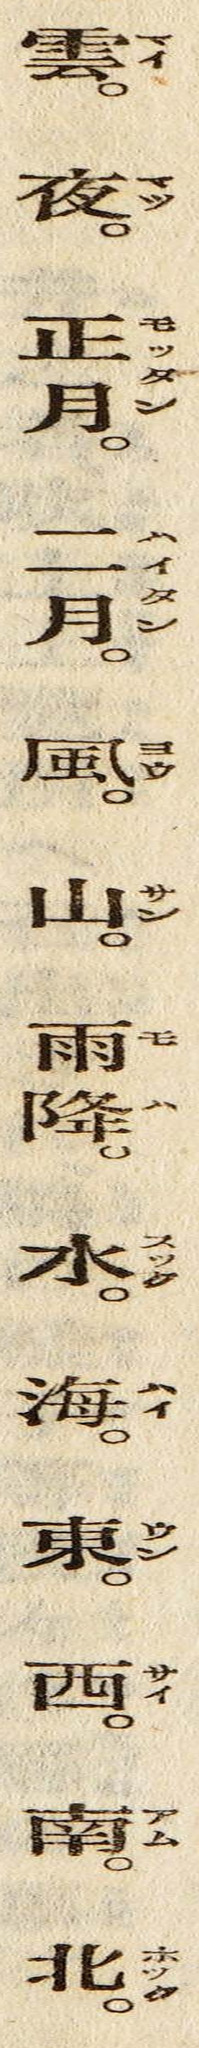雲。夜。正月。二月。風。山。雨降。水。海。東。西。南。北。
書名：日本漂流譚
